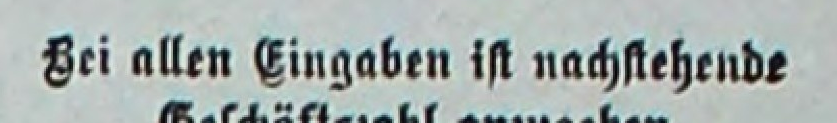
Bei allen Eingaben ist nachstehende
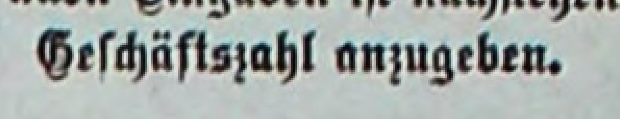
Geschäftszahl anzugeben.
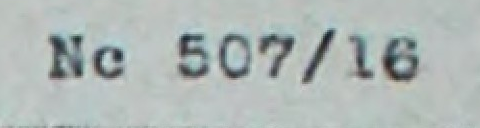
Nc 507/16
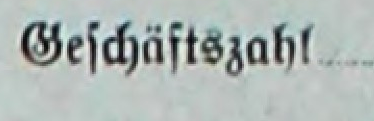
Geschäftszahl
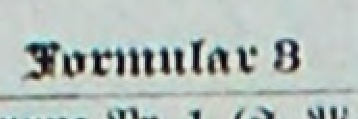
Vormular B
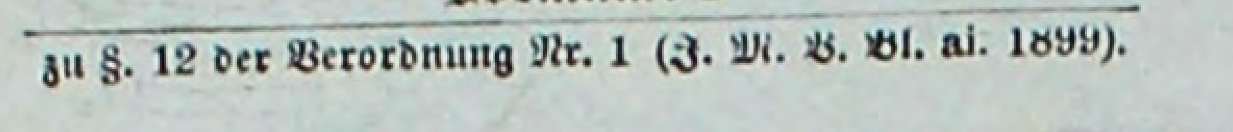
zu § 12 der Verordnung Nr. 1 (J. M. B. Bl. ai. 1899).
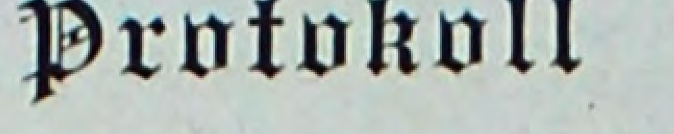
Protokoll
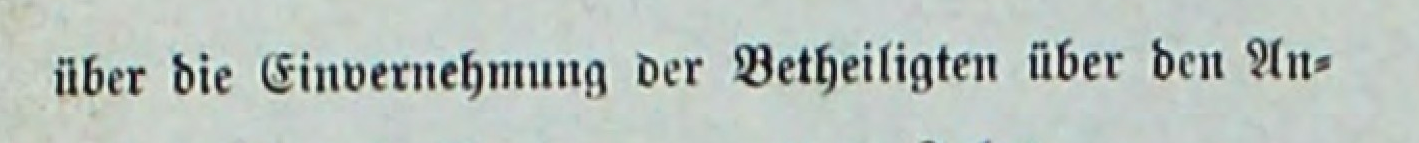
über die Einvernehmung der Betheiligten über den An„
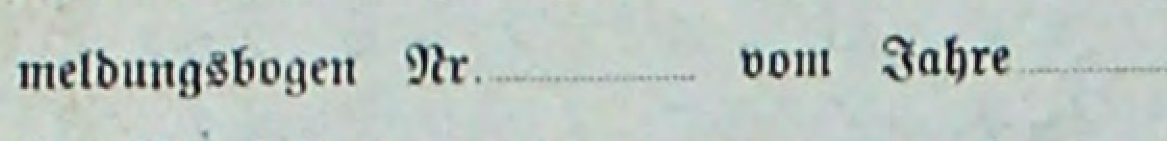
meldungsbogen Nr. vom Jahre
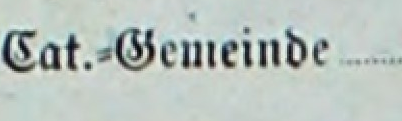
Cat.=Gemeinde
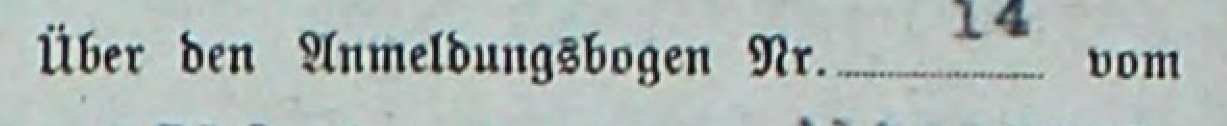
Über den Anmeldungsbogen Nr. 14 vom
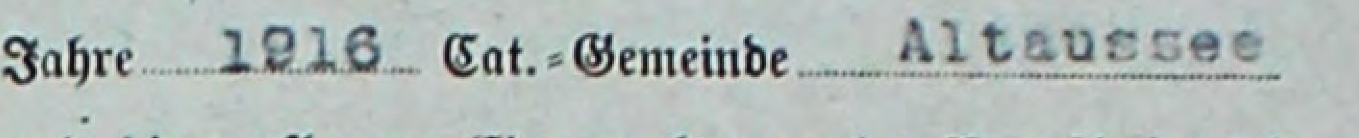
Jahre 1916 Cat.=Gemeinde Altaussee
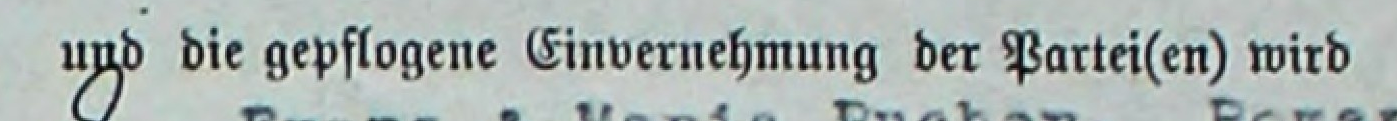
und die gepflogene Einvernehmung der Partei(en) wird
